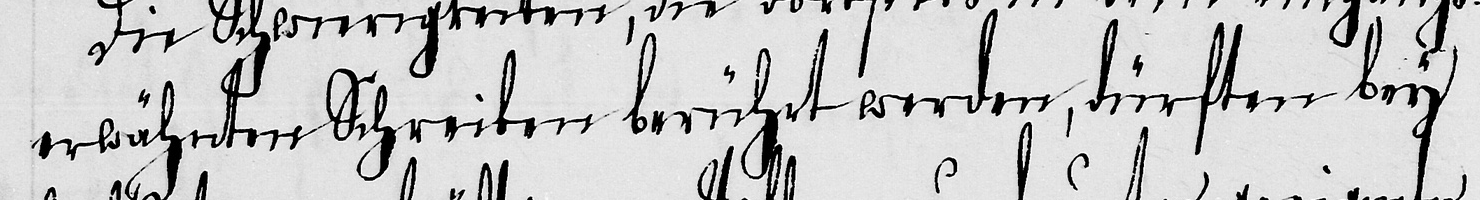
erwähnten Schreiben berührt werden, dürften bey
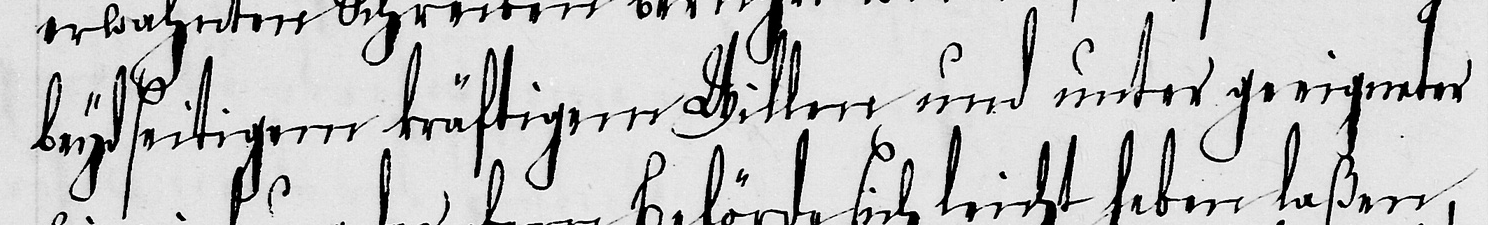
beydseitigem kräftigem Willen und unter geeigneter
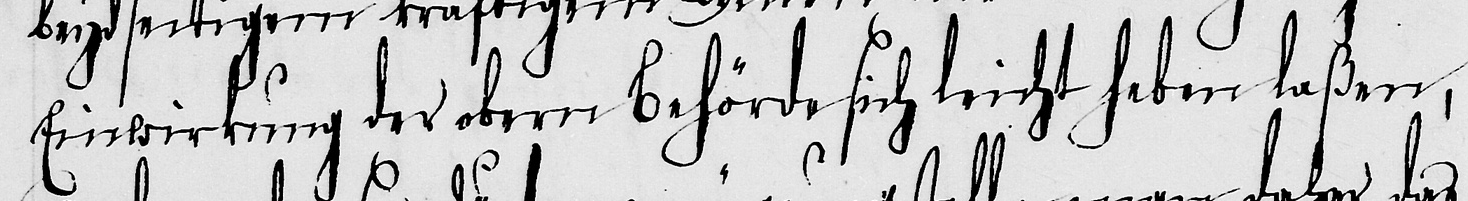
Einwirkung der obern Behörde sich leicht heben laßen,
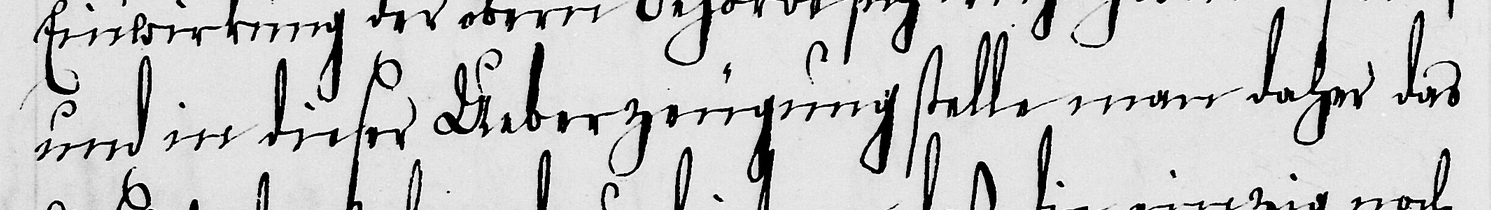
und in dieser Ueberzeugung stelle man daher das
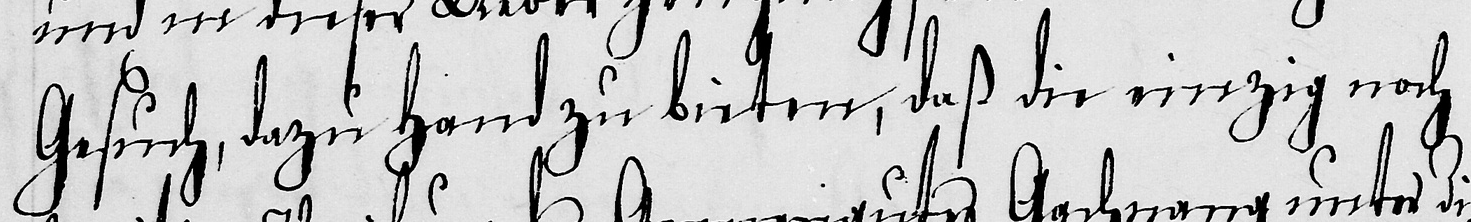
Gesuch, dazu Hand zu bieten, daß die einzig noch
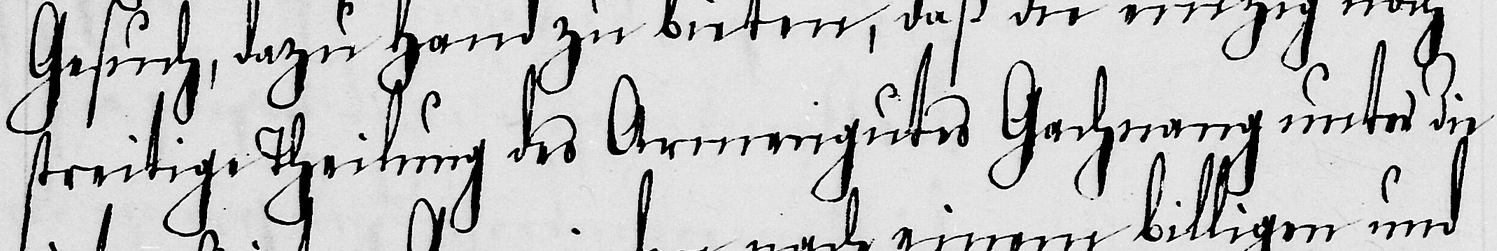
streitige Theilung des Armengutes Gachnang unter die
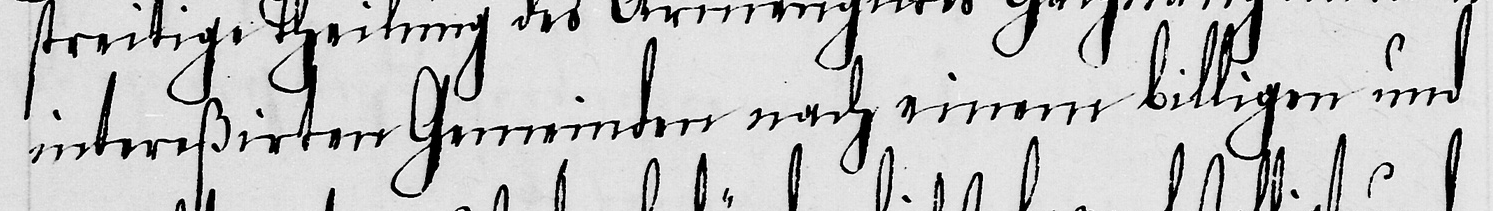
intereßirten Gemeinden nach einem billigen und
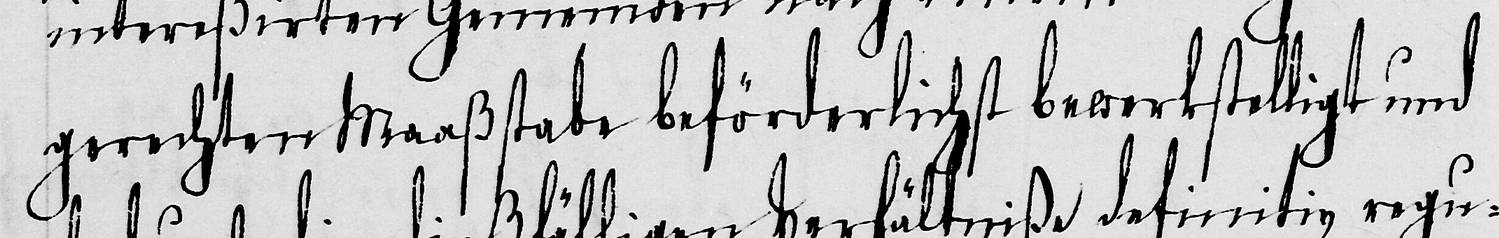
gerechten Maaßstabe beförderlichst bewerkstelligt und
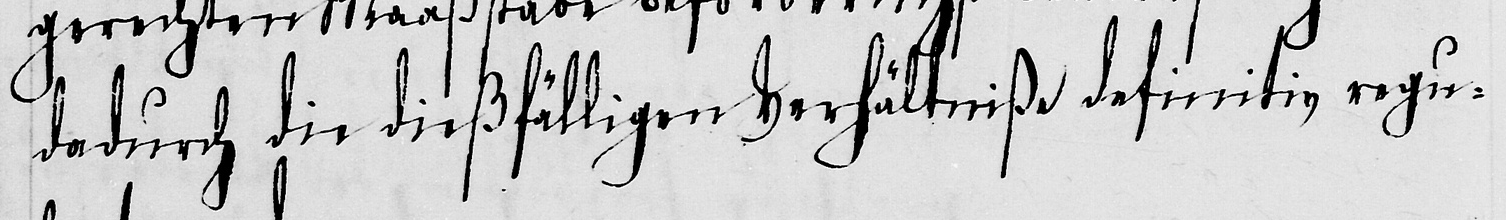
dadurch die dießfälligen Verhältniße definitiv regu¬
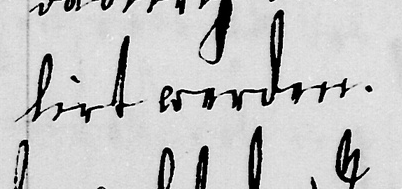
lirt werden.
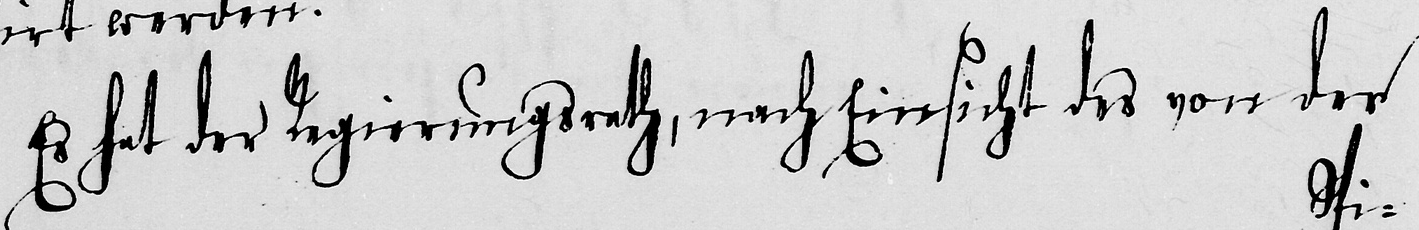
Es hat der Regierungsrath, nach Einsicht des von der
